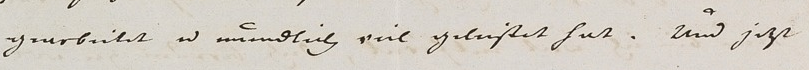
gearbeitet u unendlich viel geleistet hat. Und jetzt
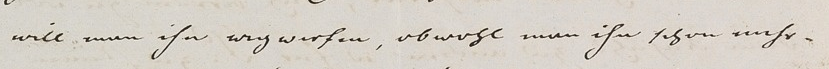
will man ihn wegwerfen, obwohl man ihn schon mehr-
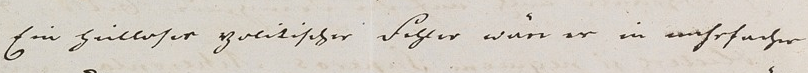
Ein heilloser politischer Fehler wäre es in mehrfacher
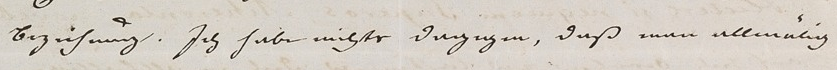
Beziehung. Ich habe nichts dagegen, daß man allmälig
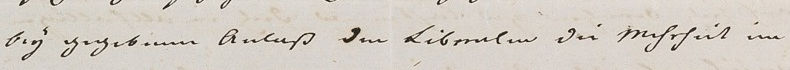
bey gegebnem Anlaß den Liberalen die Mehrheit im
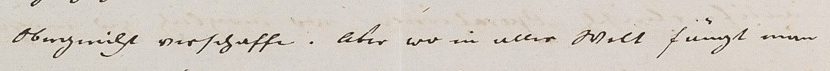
Obergericht verschaffe. Aber wo in aller Welt fängt man
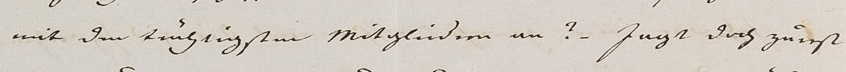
mit den tauglichsten Mitgliedern an? – Jagt doch zuerst
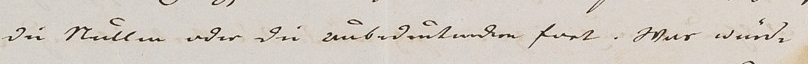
die Nullen oder die Unbedeutenden fort. Was würde
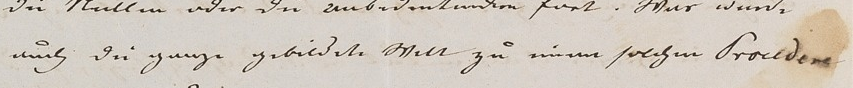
auch die ganze gebildete Welt zu einem solchen Procedere
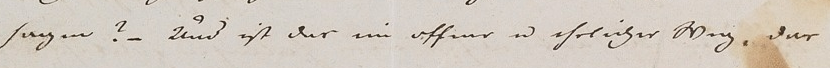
sagen? – Und ist das ein offner u ehrlicher Weg, das
